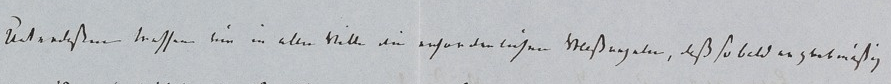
Unterdeßen treffen wir in aller Stille die erforderlichen Maßregeln, daß so bald es zwekmäßig
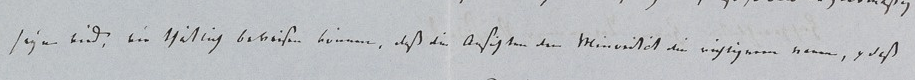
seyn wird, wir thätlich beweisen können, daß die Ansichten der Minorität die richtigeren waren, & daß
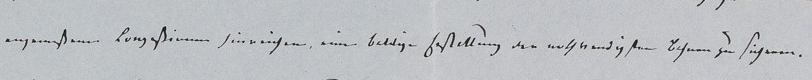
angemeßene Konzeßionen hinreichen, eine baldige Erstellung der nothwendigsten Bahnen zu sicheren.
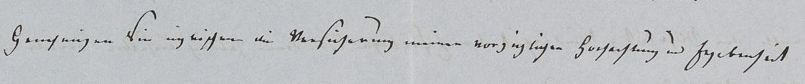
Genehmigen Sie inzwischen die Versicherung meiner vorzüglichen Hochachtung und Ergebenheit
